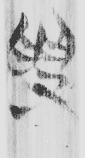受
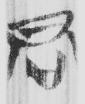君
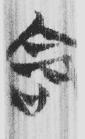命
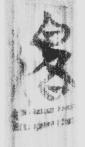退
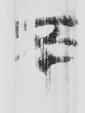不
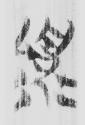寡
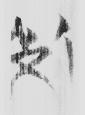死
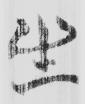生
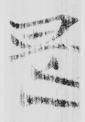是
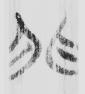非
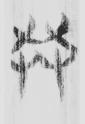共
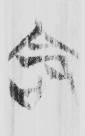命
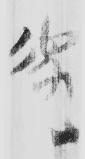虎
